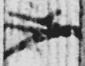之
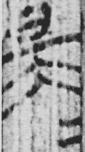昊天
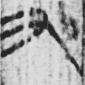又（有）
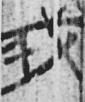城（成）
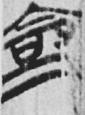命
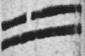二
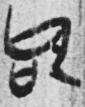句（后）
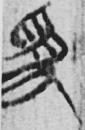受
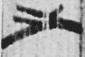之
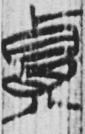貴
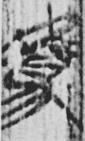○（且）
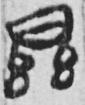○（顯）
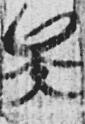矣
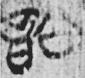訟
